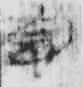惠
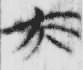夫
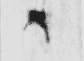人
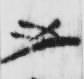之
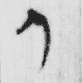人
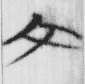文
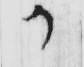人
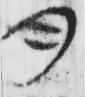月
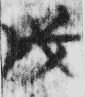戊
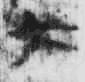大
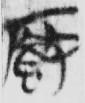○（厩）
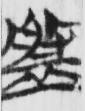盤
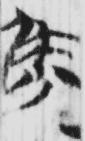○（沙）
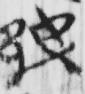○（鄢）
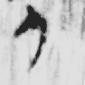人
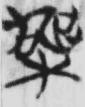桑
